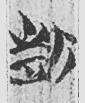折
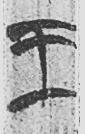王
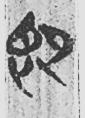即
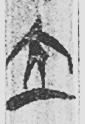立
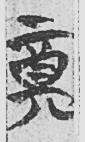奠
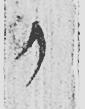人
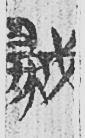{帚戈}
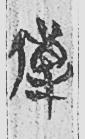{人牛賣}
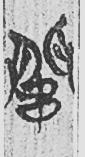{門串}
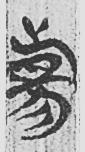{㫃昜}
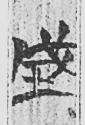城
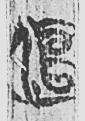洹
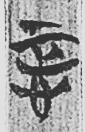{正心}
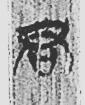君
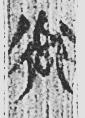率
